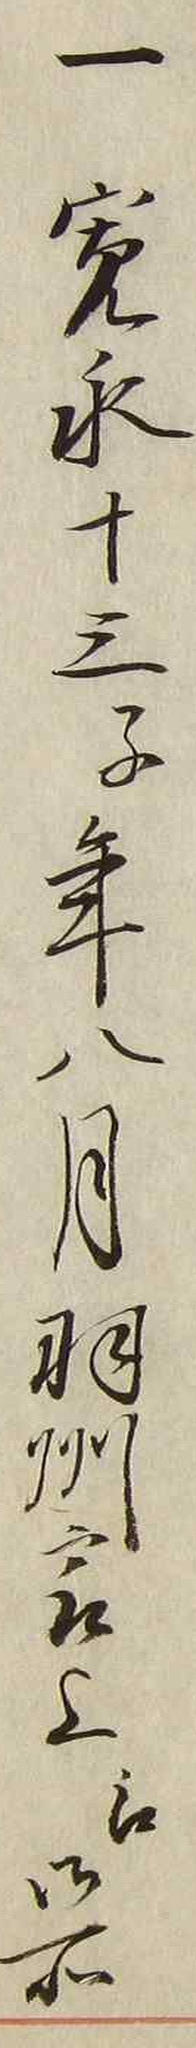一寛永十三子年八月羽州最上江御所

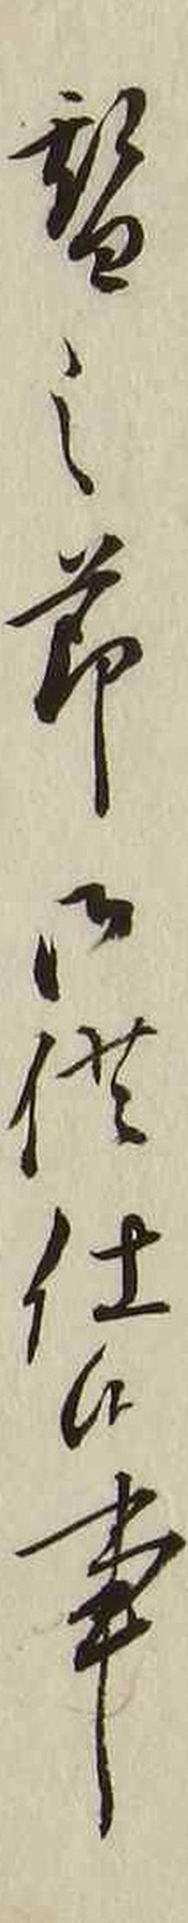替之節御供仕候事
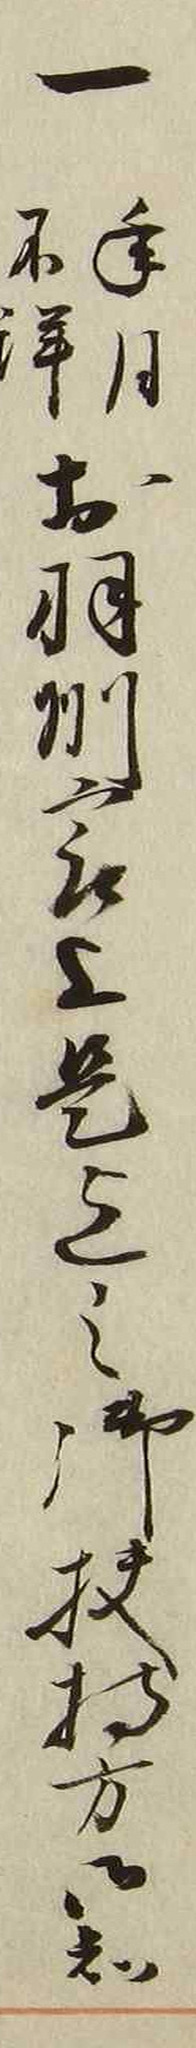不詳於羽州最上是迄之御扶持方御知
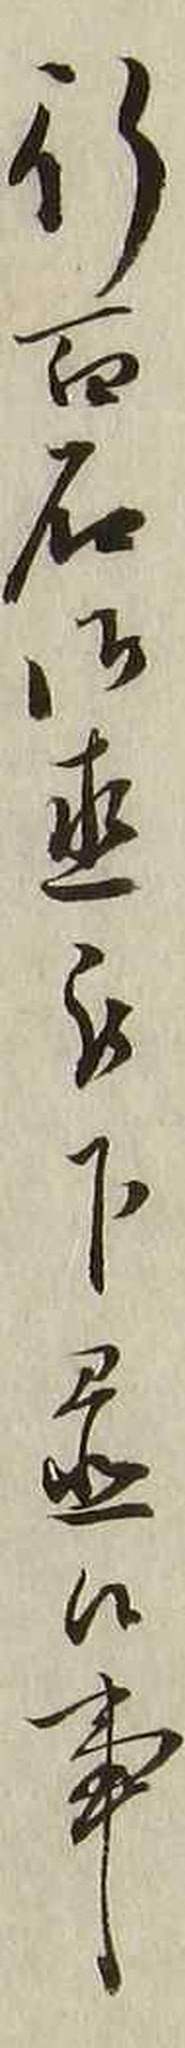行百石御直被下置候事
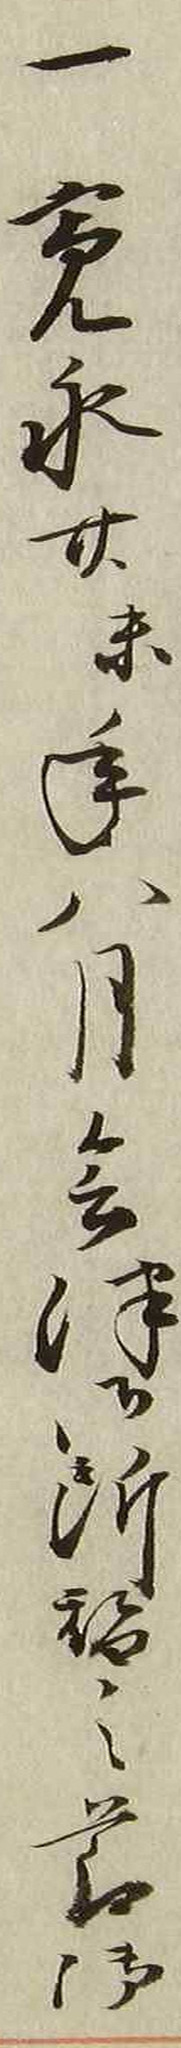一寛永廿未年八月会津御所替之節御
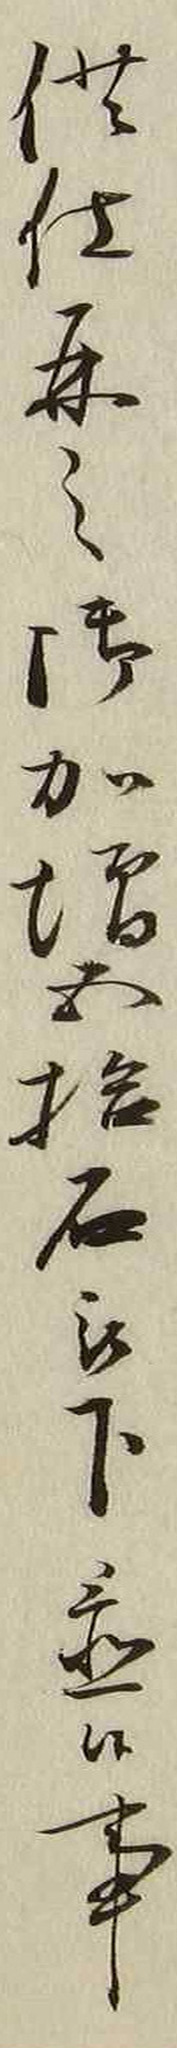供仕并之御加増五拾石被下置候事
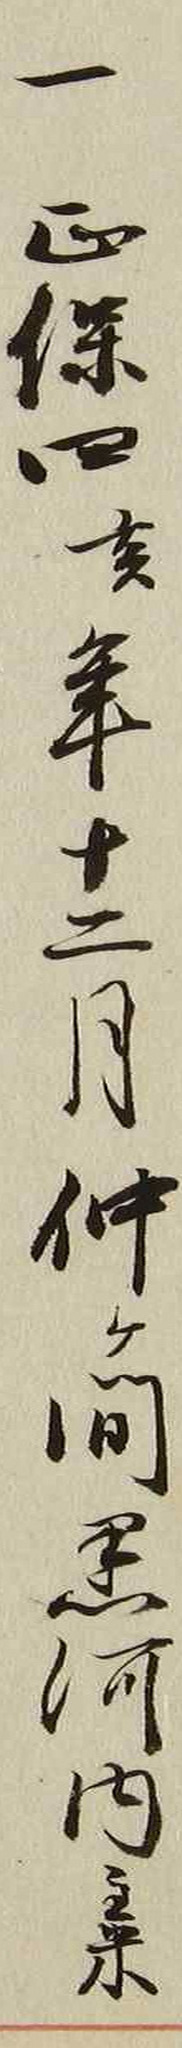一正保四亥年十二月仲ケ間黒河内主米
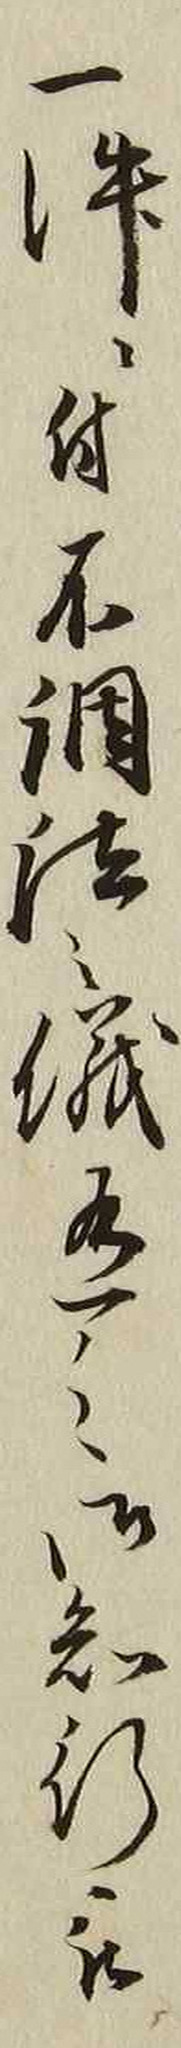一件ニ付不調法之儀有之御知行被
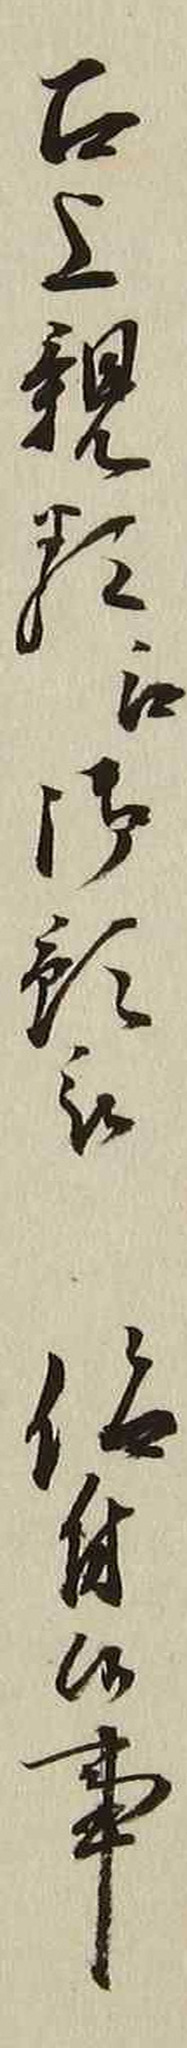召上親類江御預被仰付候事
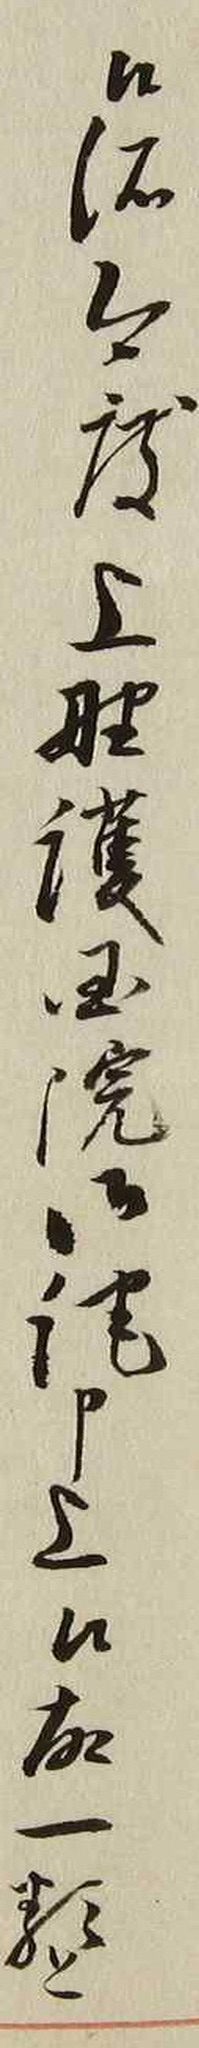候所今度上野護国院御詫申上候故一類と
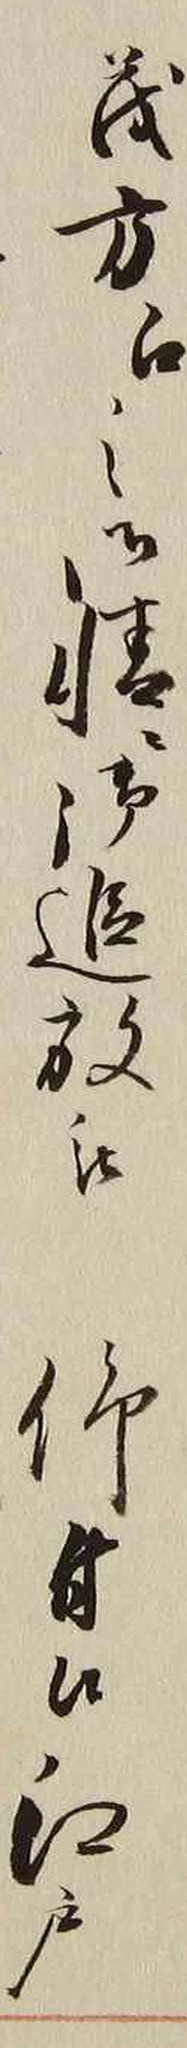茂方江之御情ニ御追放被仰付候江戸
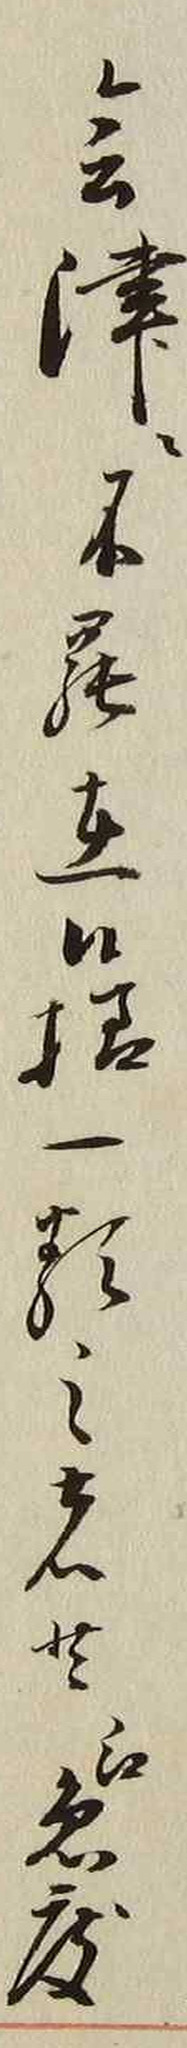会津ニ不罷在候様一類之者共江急度
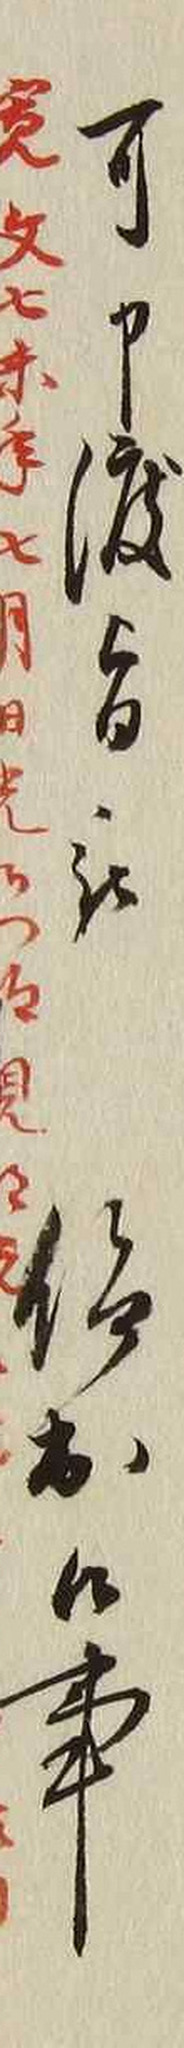可申渡旨被仰出候事
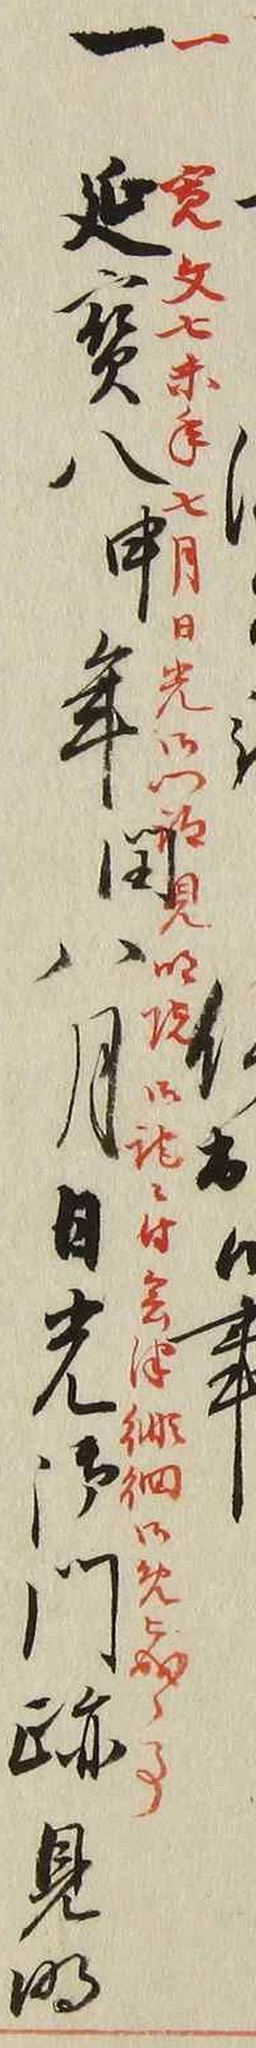一延宝八申年閏八月日光御門跡見明
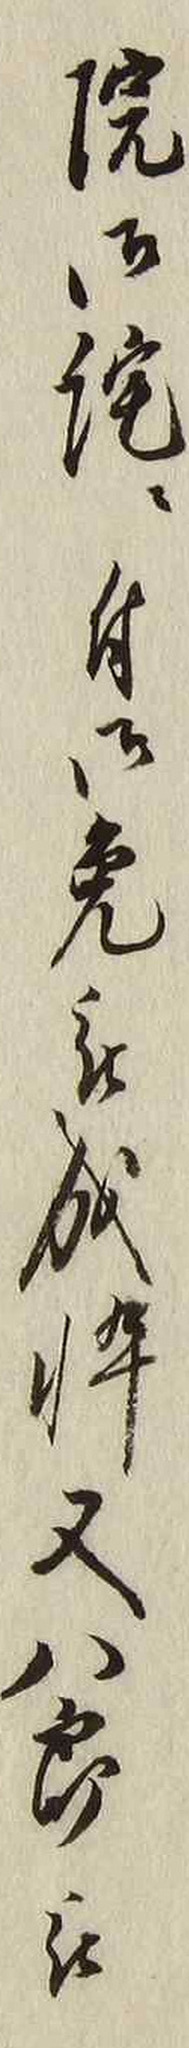院御詫ニ付御免被成忰又八郎被
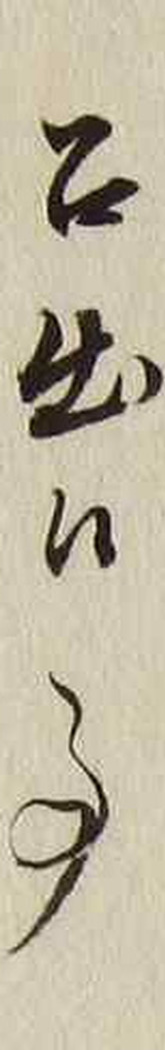召出候事
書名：諸士系譜　巻之22　い之部22
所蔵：会津若松市立会津図書館
